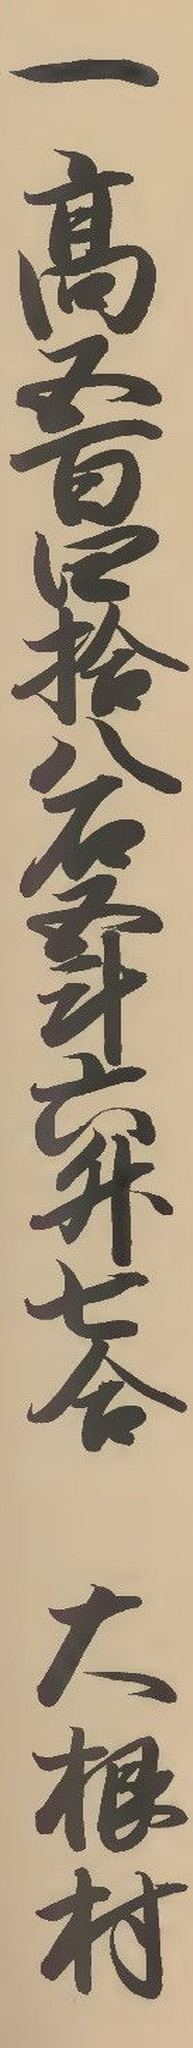一高五百四拾八石五斗六升七合大根村
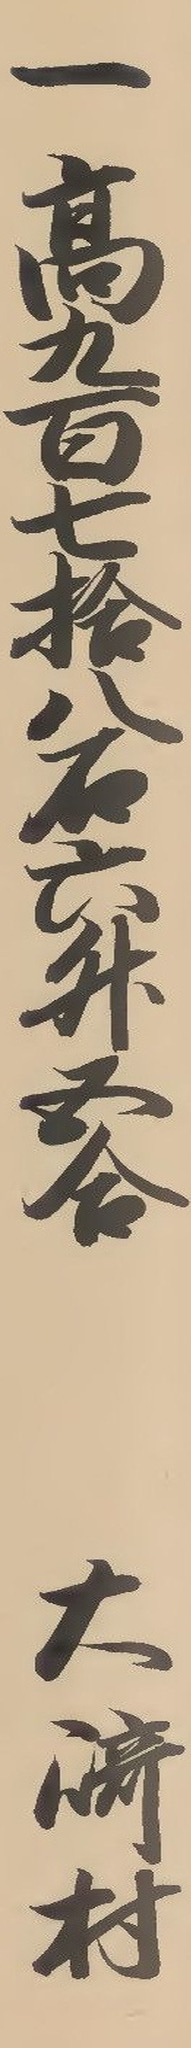一高九百七拾八石六升五合大崎村
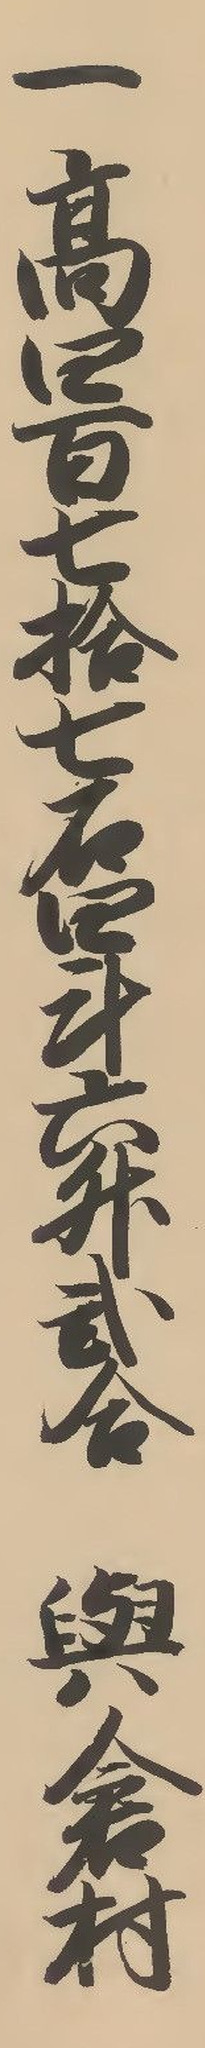一高四百七拾七石四斗六升弐合与倉村
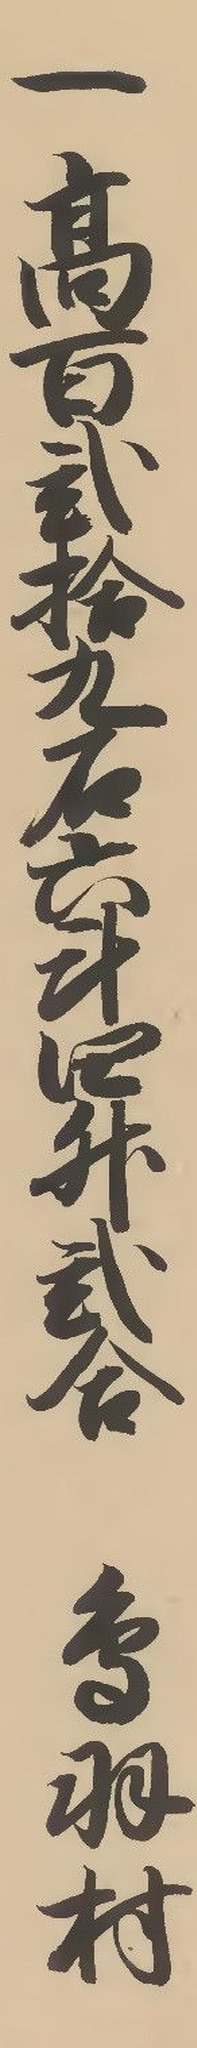一高百弐拾九石六斗四升弐合鳥羽村
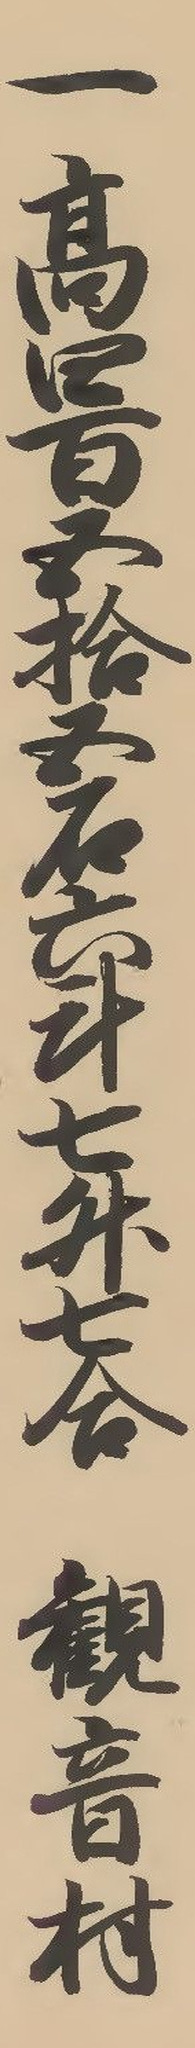一高四百五拾五石六斗七升七合観音村

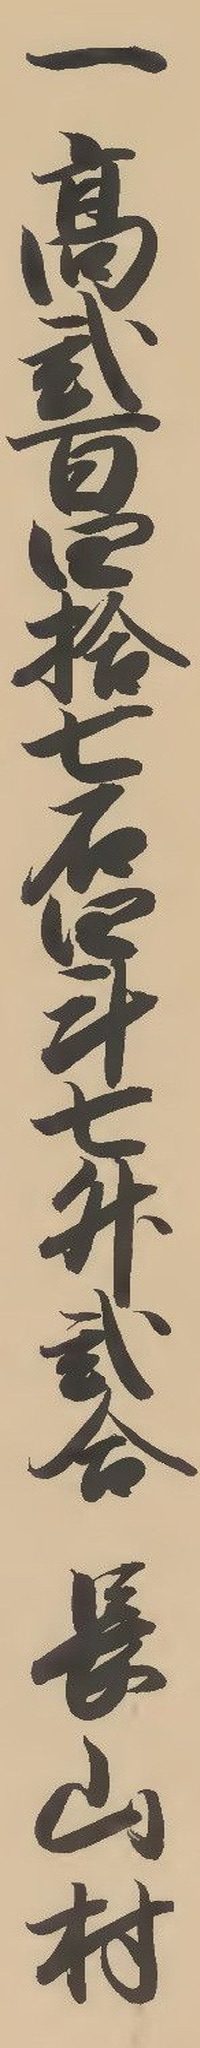一高弐百四拾七石四斗七升弐合長山村
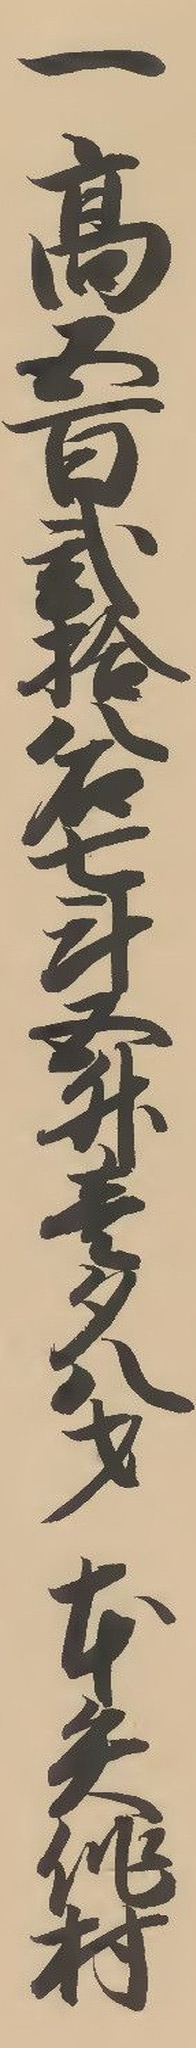一高五百弐拾八石七斗五升壱勺八才本矢作村
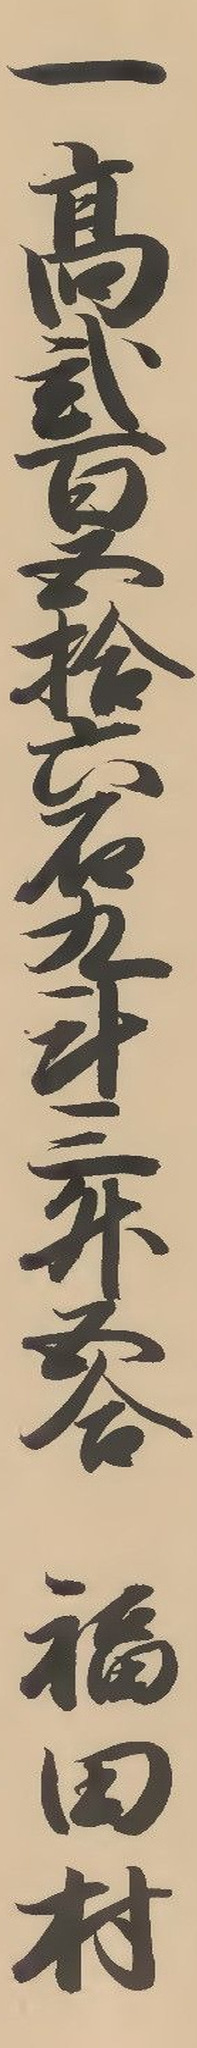一高弐百五拾六石九斗三升五合福田村
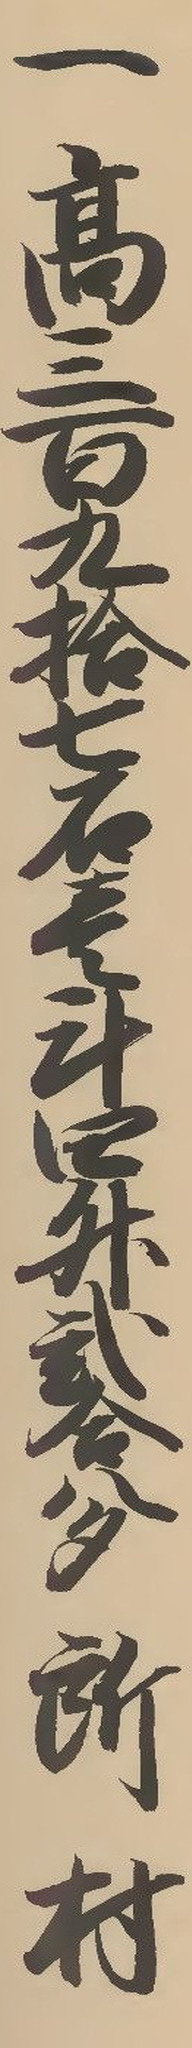一高三百九拾七石壱斗四升弐合八勺所村
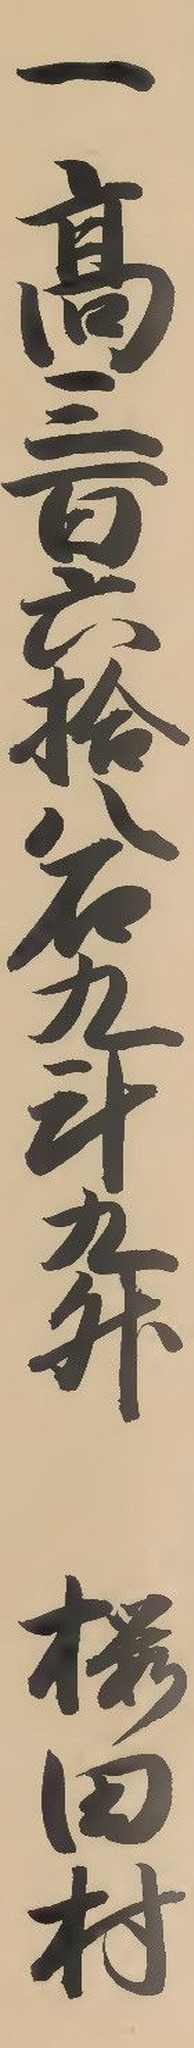一高三百六拾八石九斗九升桜田村
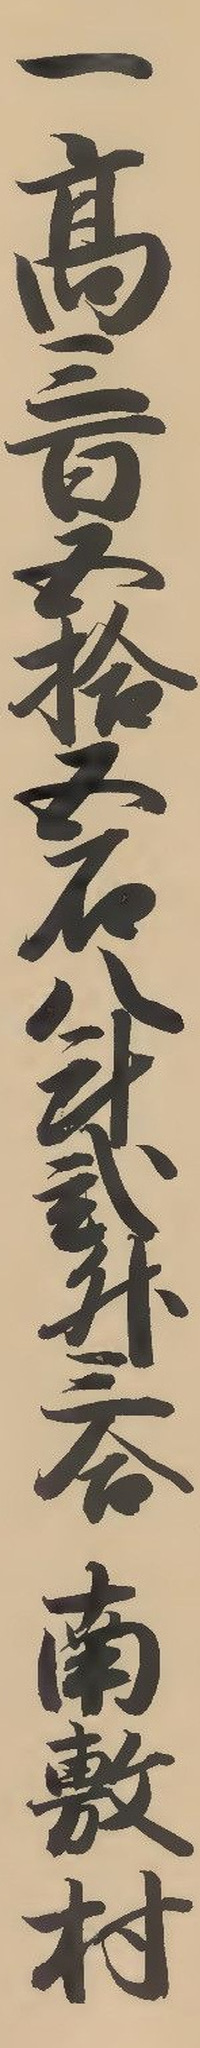一高三百五拾五石八斗弐升三合南敷村
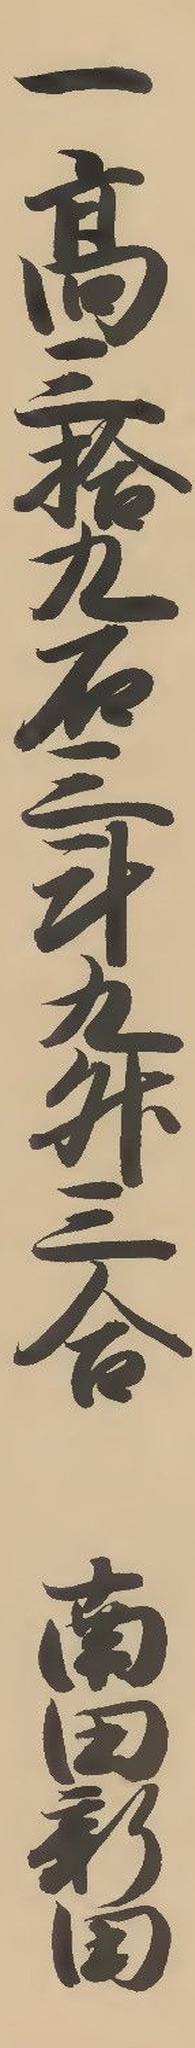一高三拾九石三斗九升三合南田新田
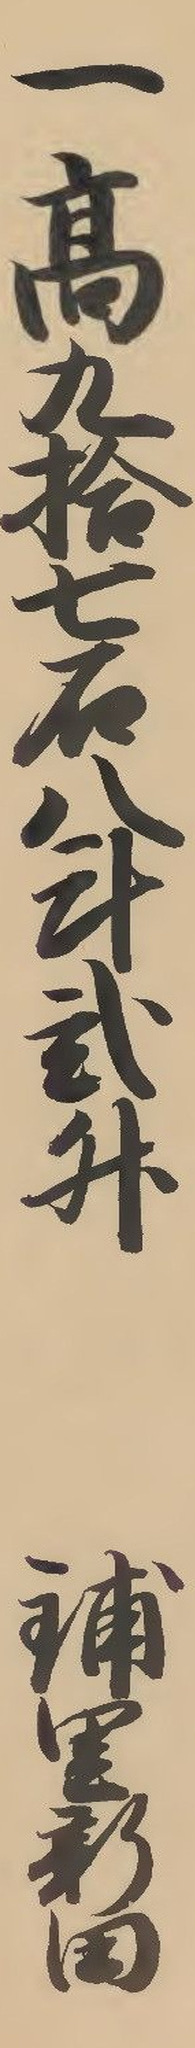一高九拾七石八斗弐升鋪里新田

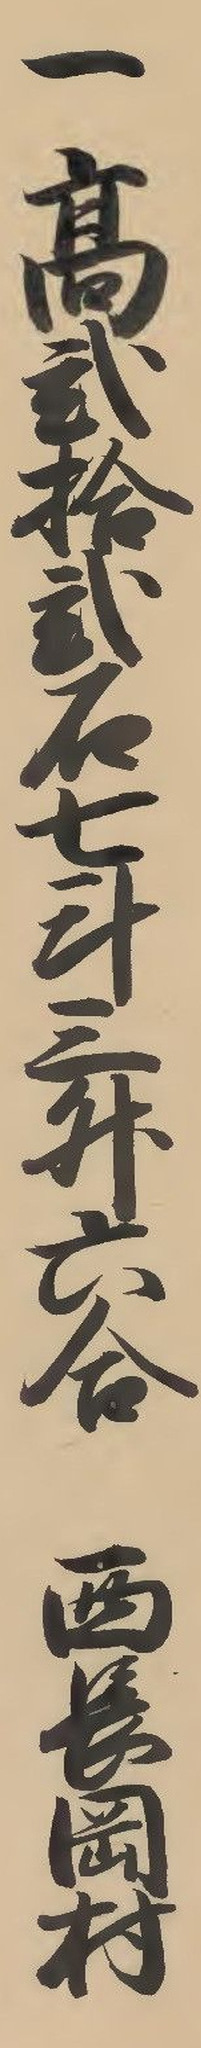一高弐拾弐石七斗三升六合西長岡村
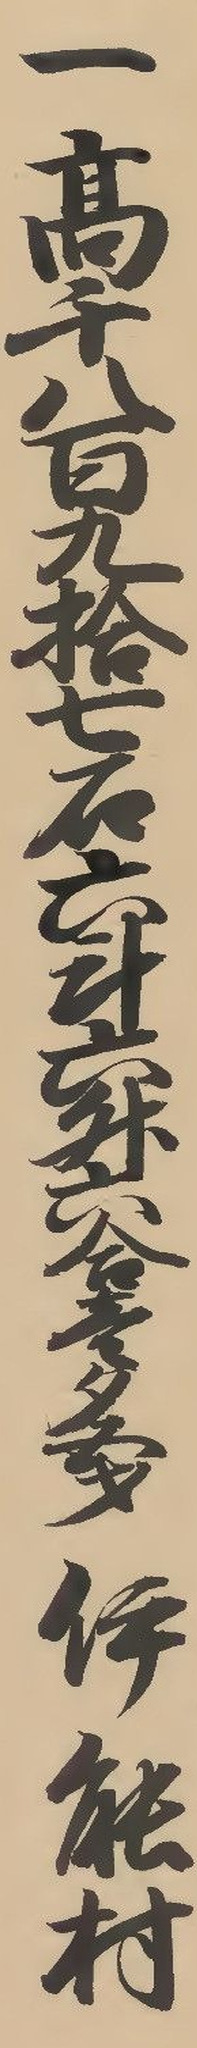一高千八百九拾七石六斗六升六合壱勺五才伊能村
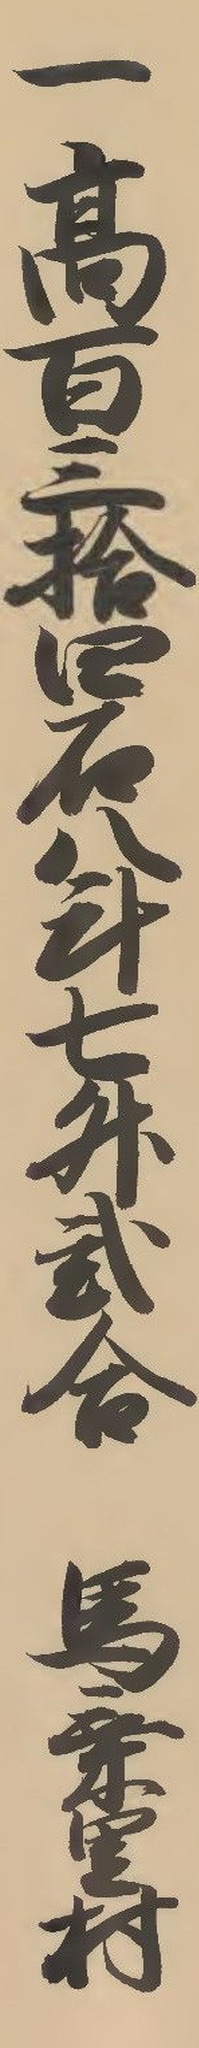一高百三拾四石八斗七升弐合馬乗里村
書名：下総国郷帳
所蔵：国立公文書館 National Archives of Japan
